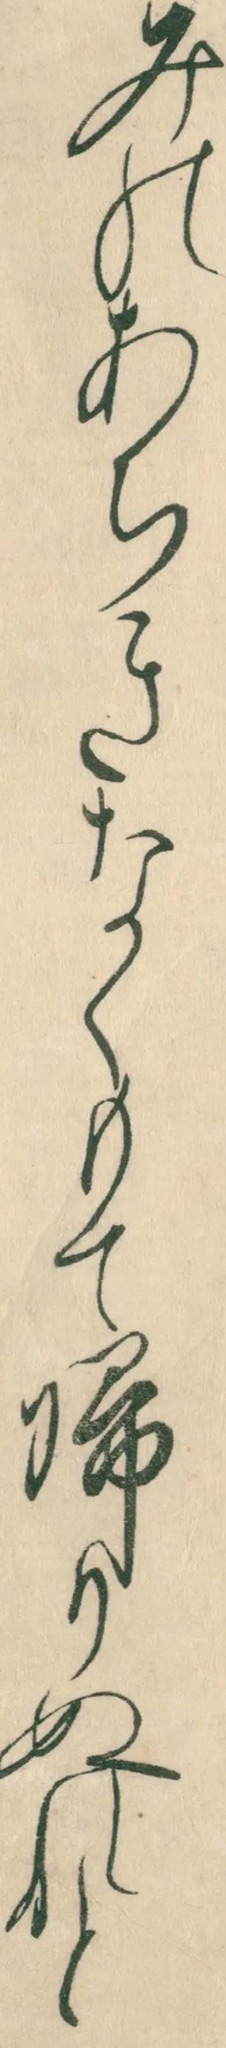みのあちきなくもて帰りぬれと
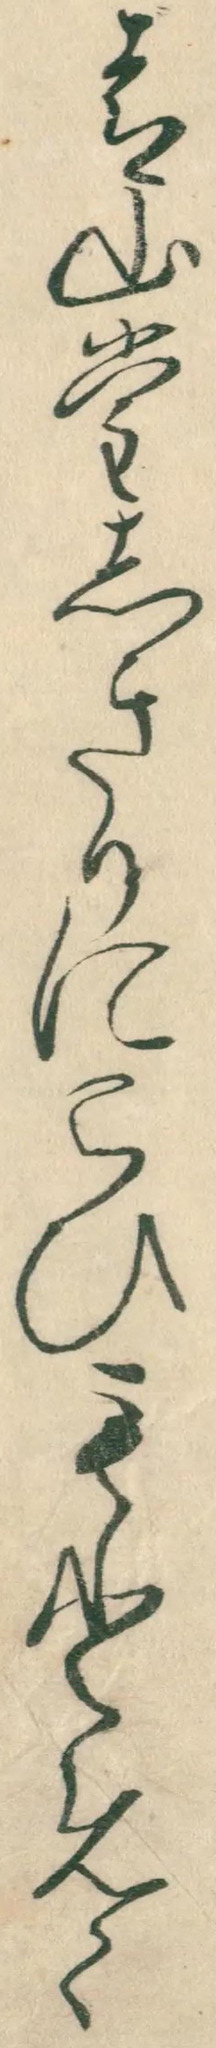青山堂しきりにわひもとめて
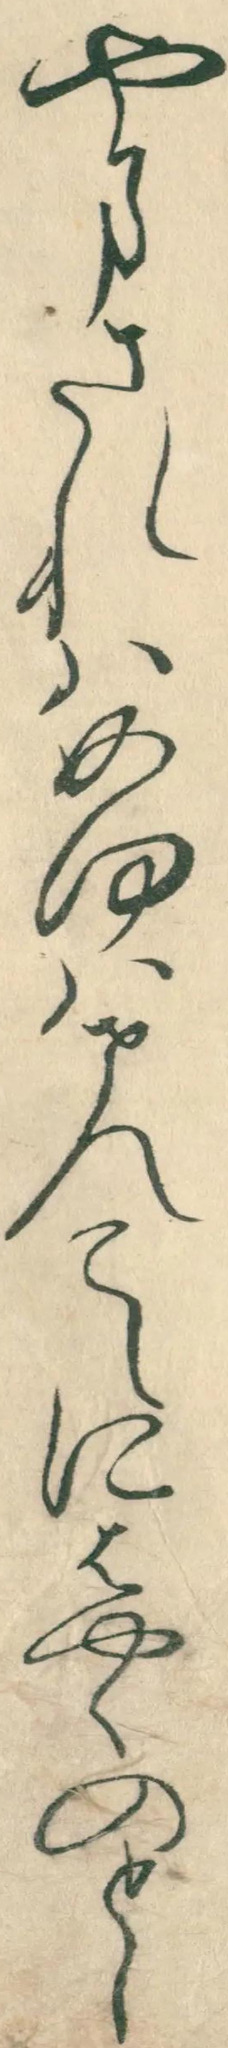やまされは如何はせんこしにはやくのとし
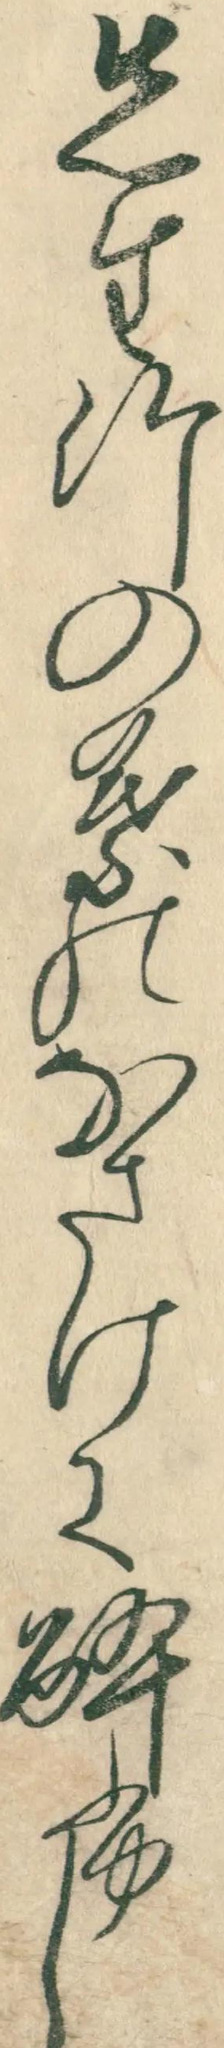先生竹の葉のなさけに酔ふし
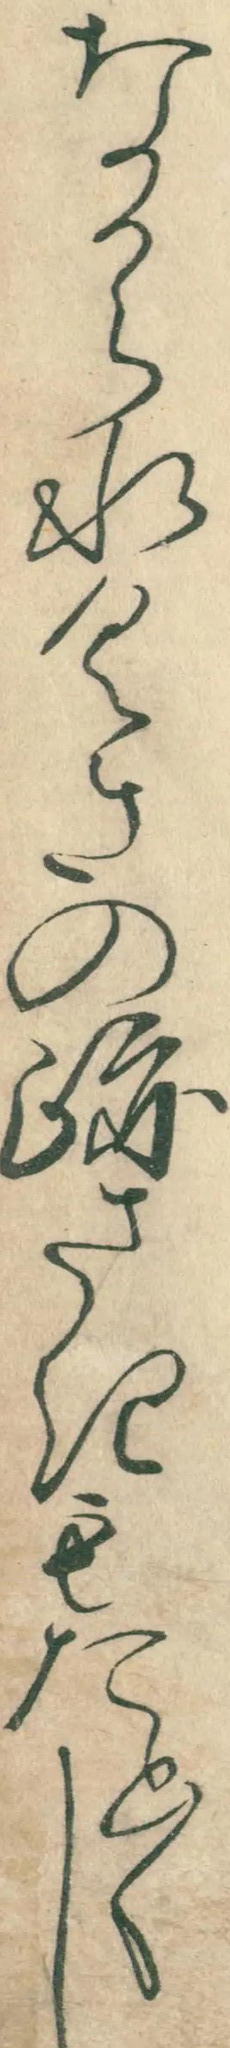なから水くきの跡さきもたと〳〵し

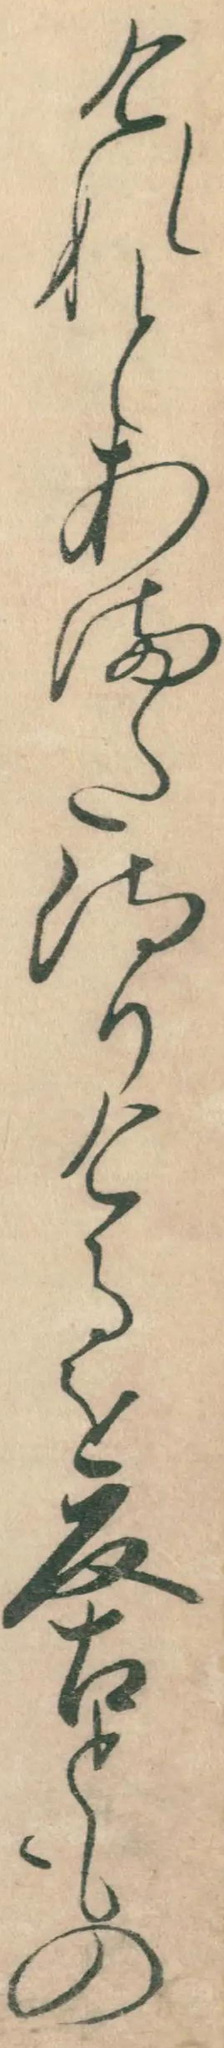けれとあまた侍りけるを反古ともの
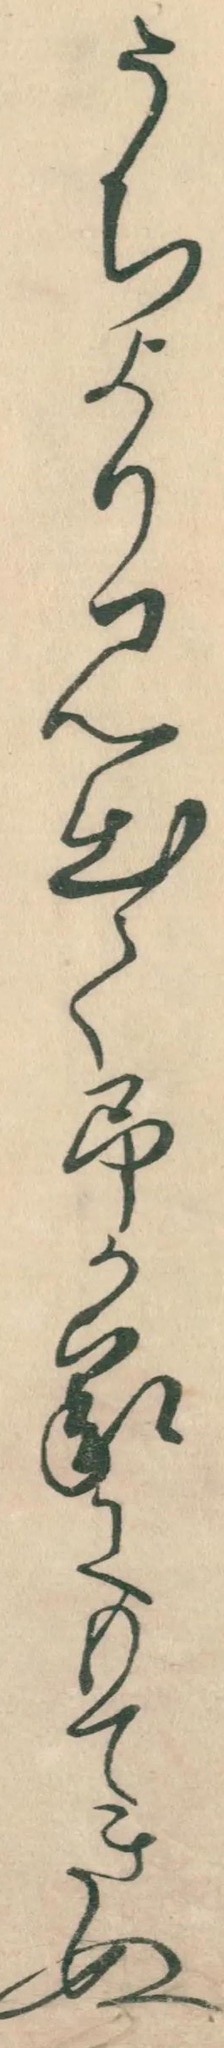うちより見出て予か家にもてきぬ
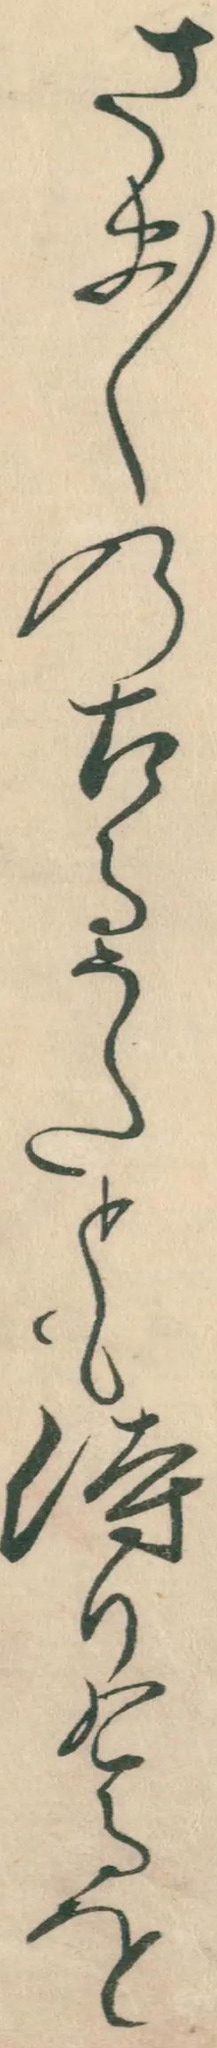さま〳〵の古るうたとも侍りけるを
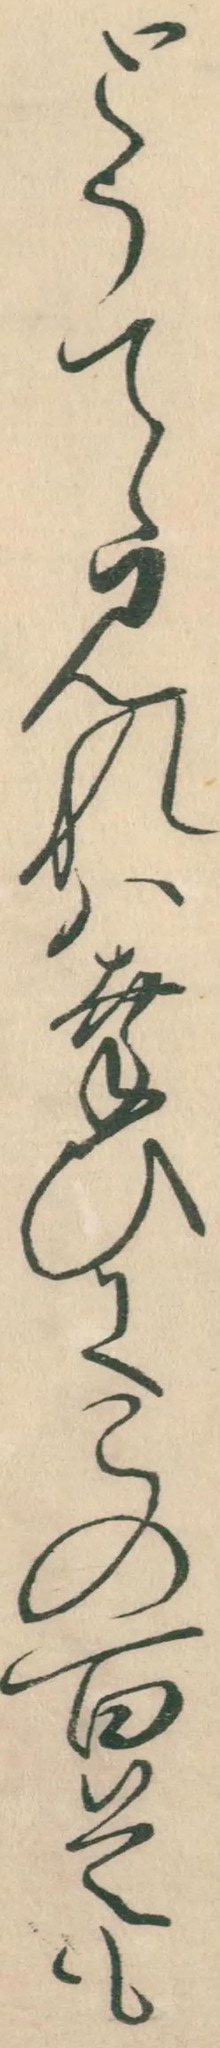とうてゝ見れは幸ひにこの百首も
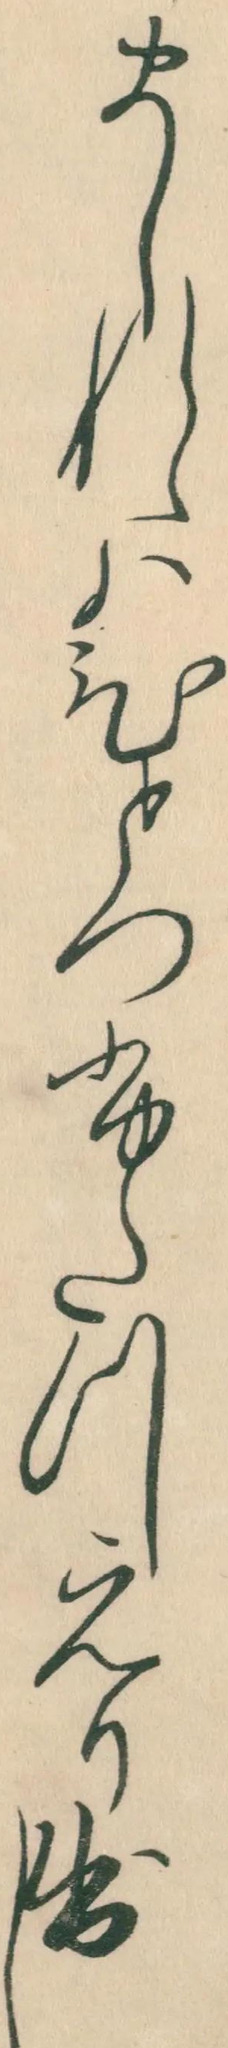ましれゝはひとつふたつえり出し
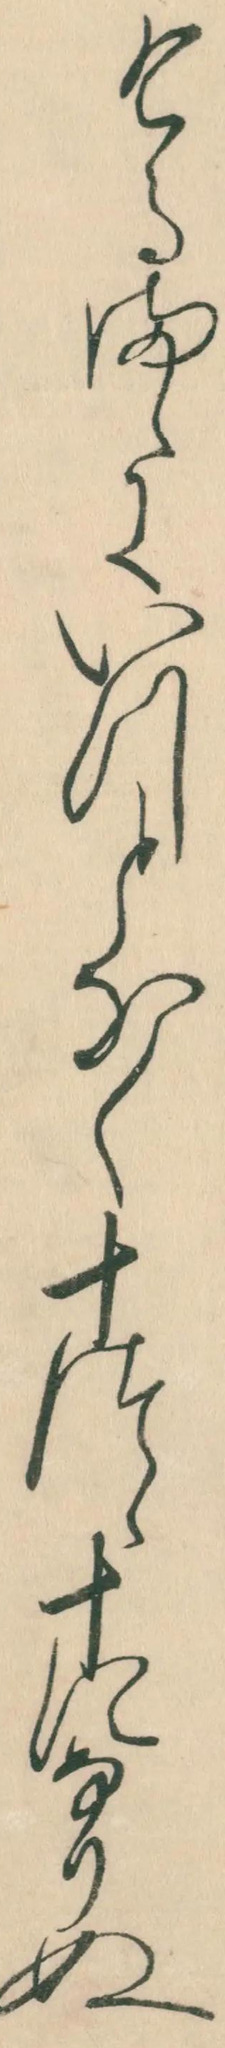けるまゝにいつとなく十つゝ十になりぬ
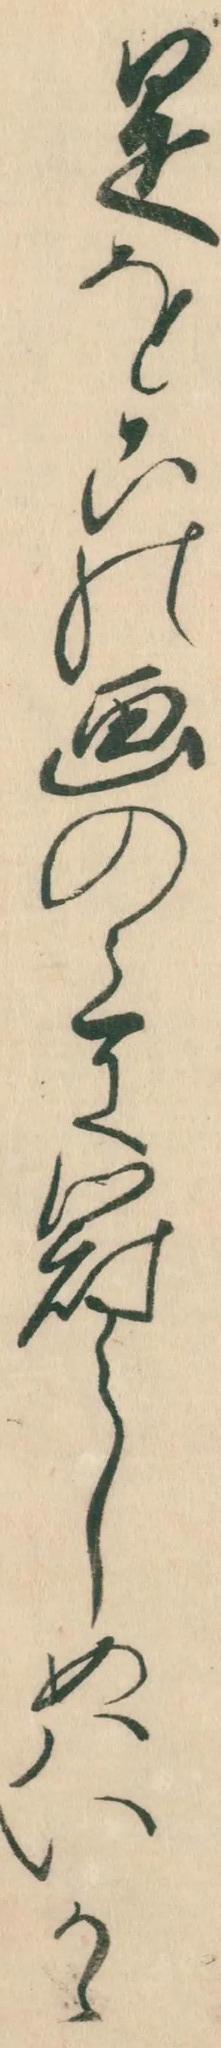是をこの画の上に冠しめはいかゝ
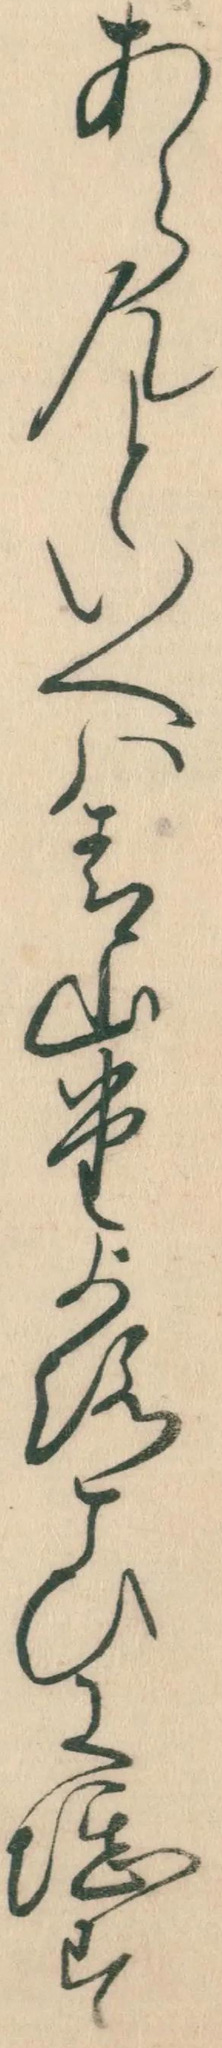あらんといへは青山堂よろこひに堪す
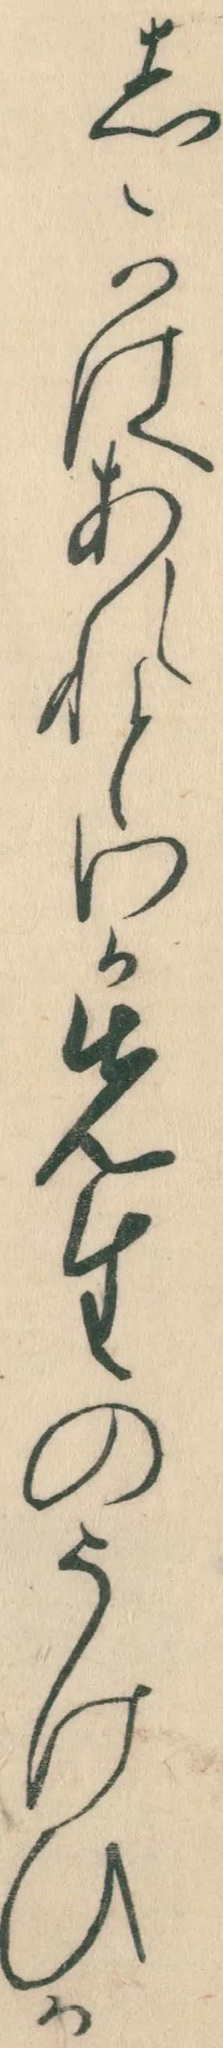しかはあれとわか先生のうけひか
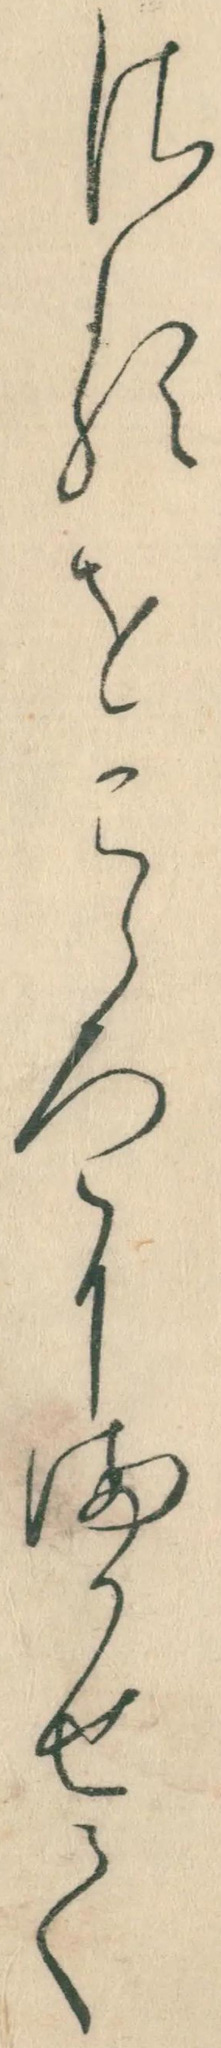さるをこゝろにまかせて
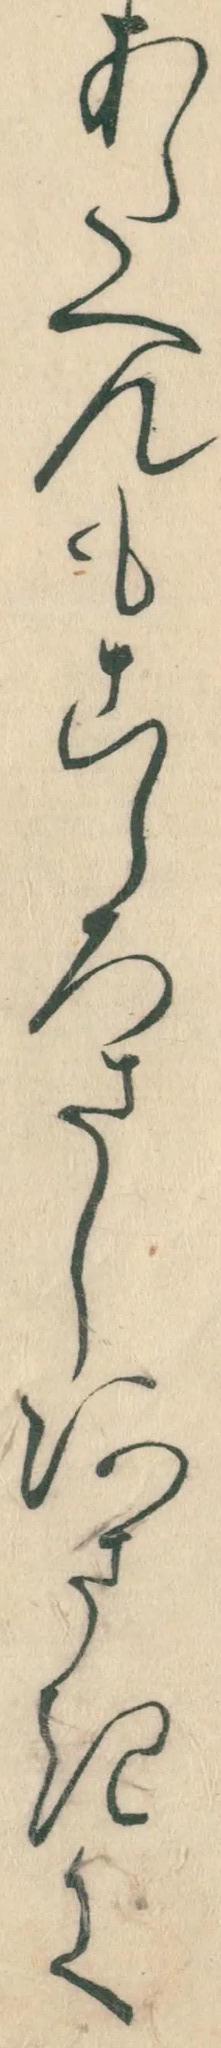あたへんもこゝろさしあさきに
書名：錦百人一首あつま織
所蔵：国立国会図書館 National Diet Library, JAPAN
